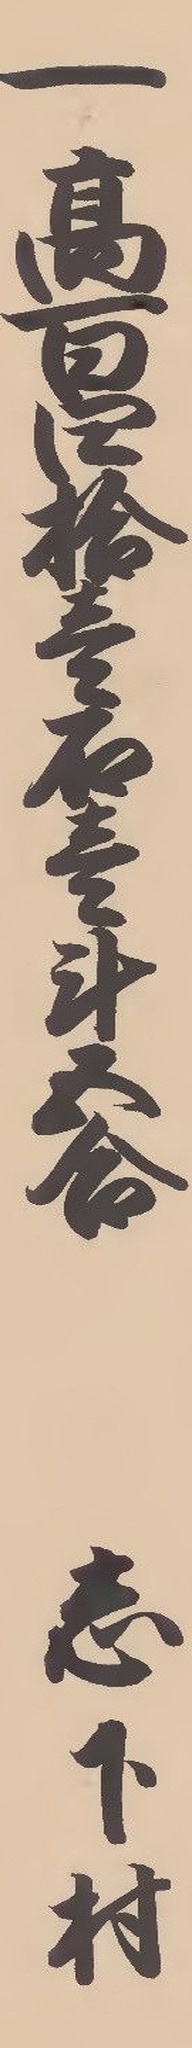一高百四拾壱石壱斗五合志下村
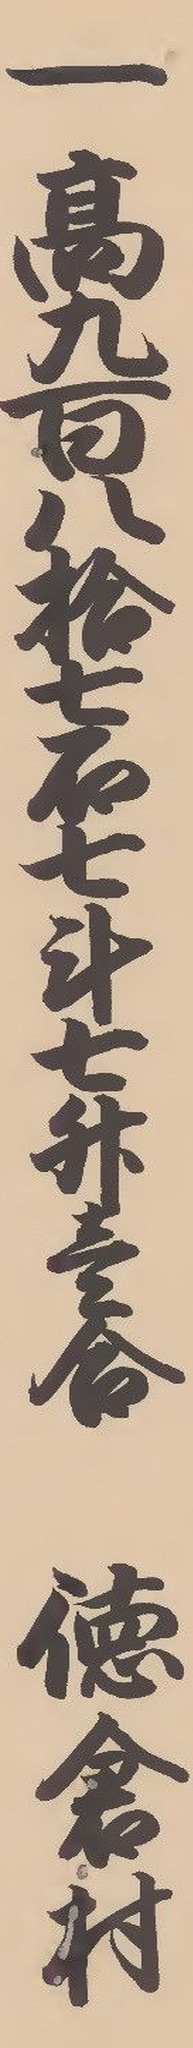一高九百八拾七石七斗七升壱合徳倉村
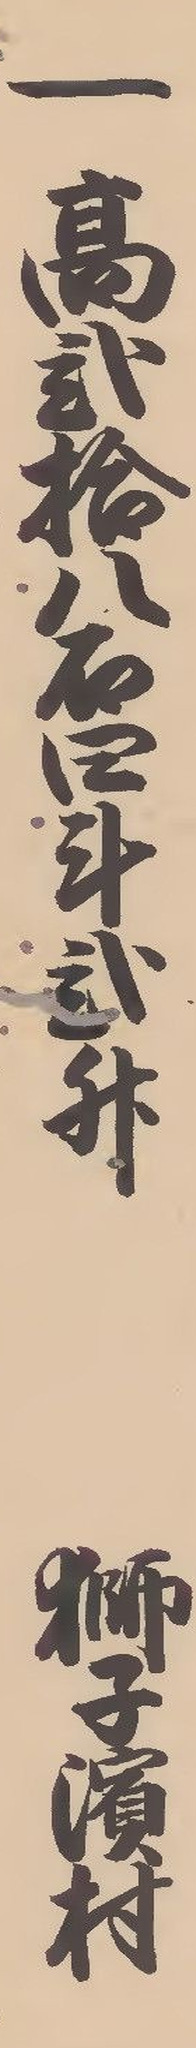一高弐拾八石四斗弐升獅子浜村

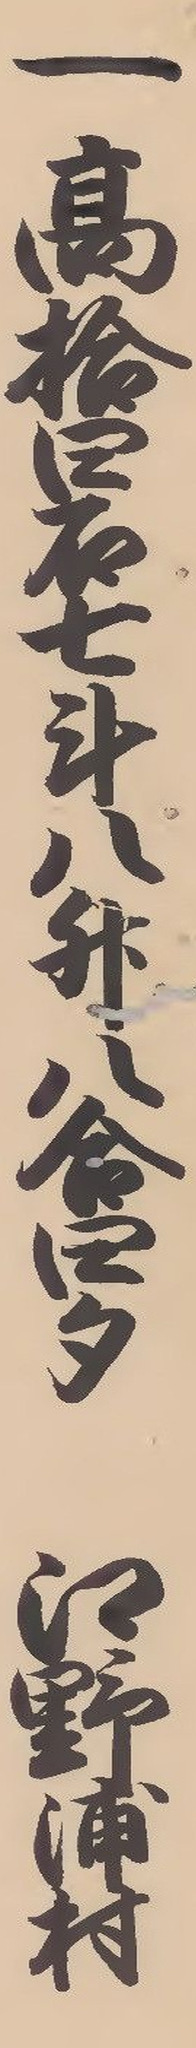一高拾四石七斗八升八合四勺江野浦村
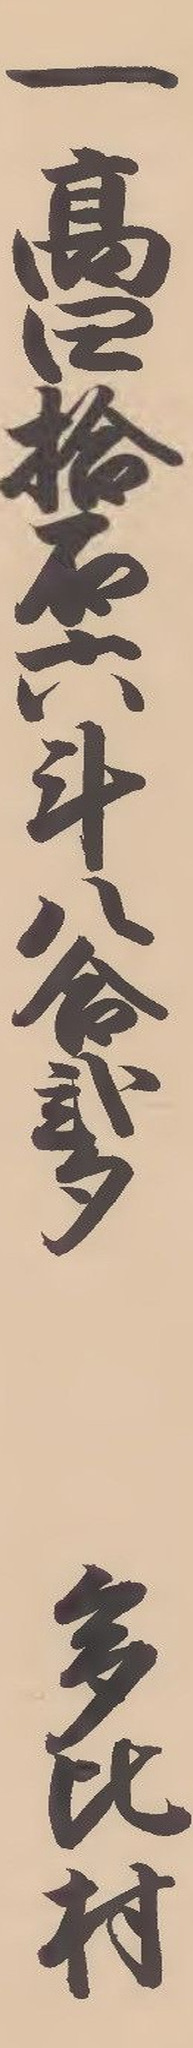一高四拾石六斗八合二勺多比村
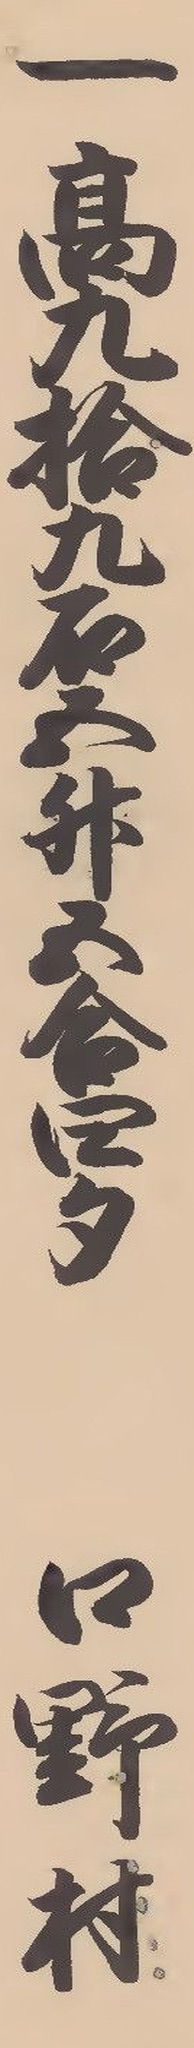一高九拾九石五升五合四勺口野村
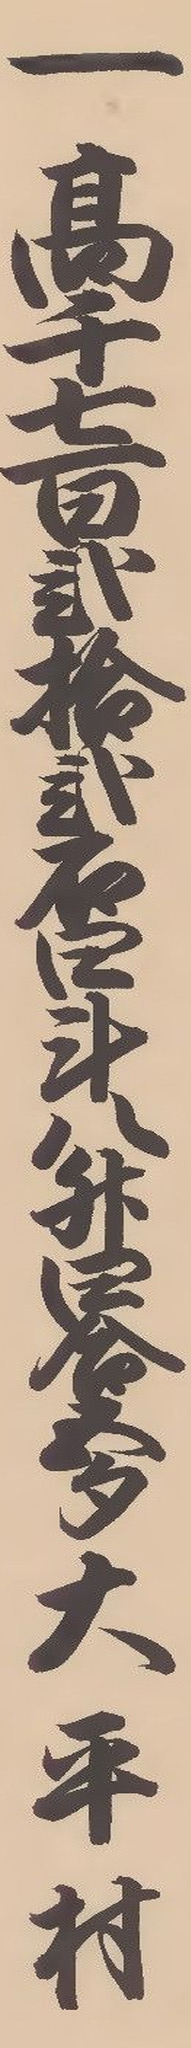一高千七百弐拾弐石四斗八升四合五勺大平村
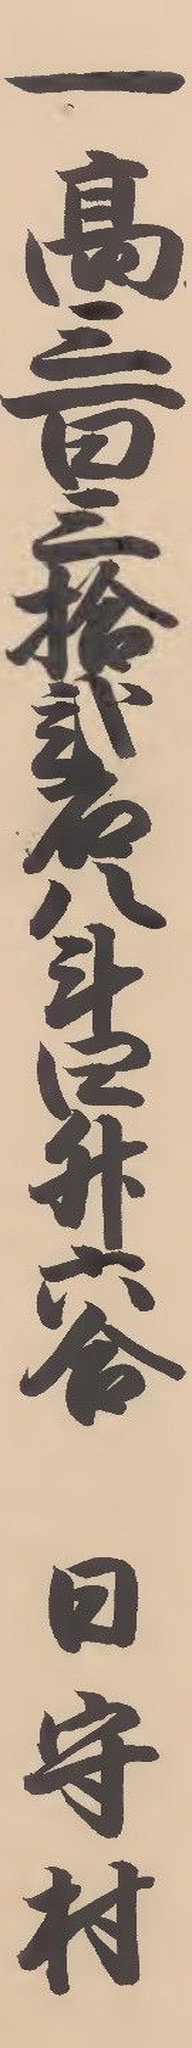一高三百三拾弐石八斗四升六合日守村
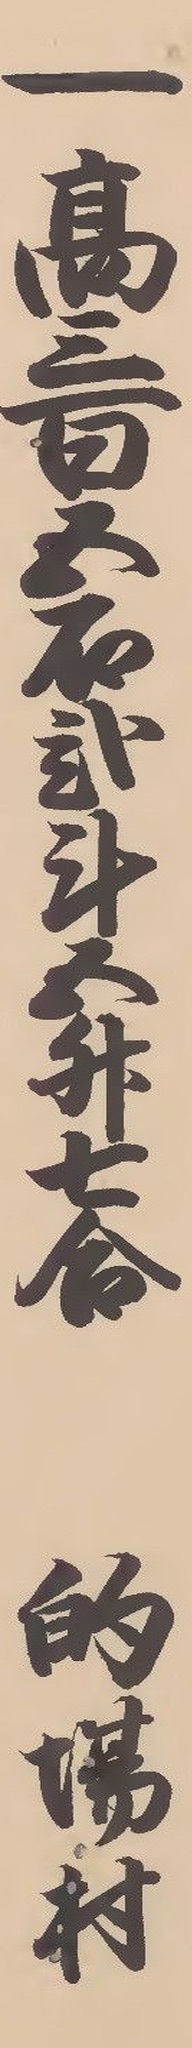一高三百五石弐斗五升七合的場村
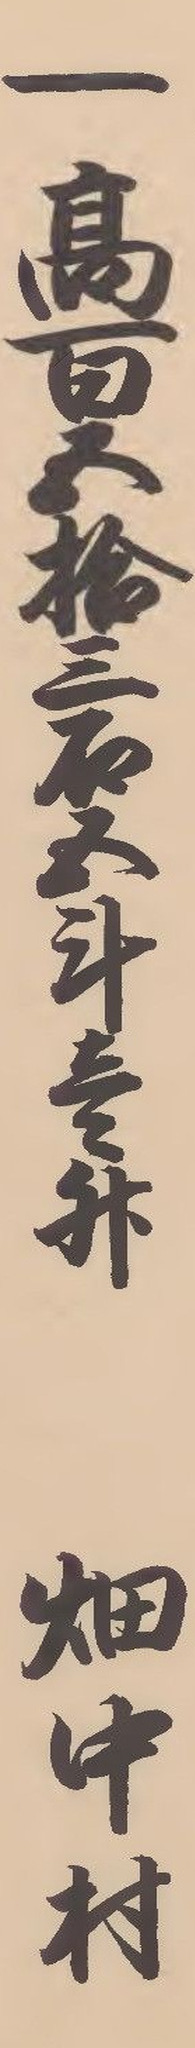一高百五拾三石五斗壱升畑中村
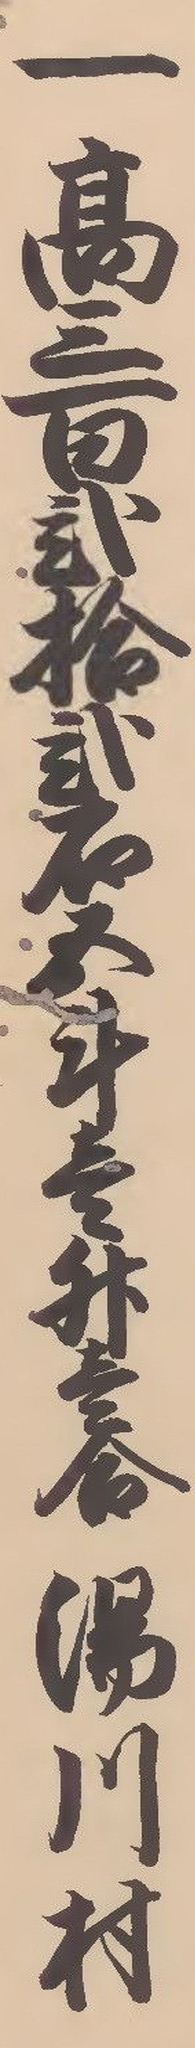一高三百弐拾弐石五斗壱升壱合湯川村

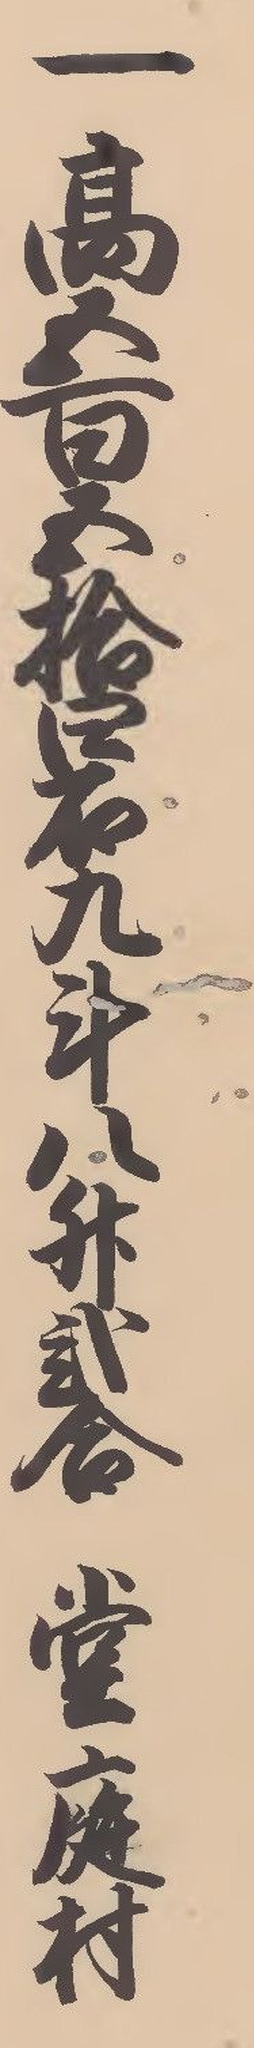一高五百五拾四石九斗八升弐合堂庭村
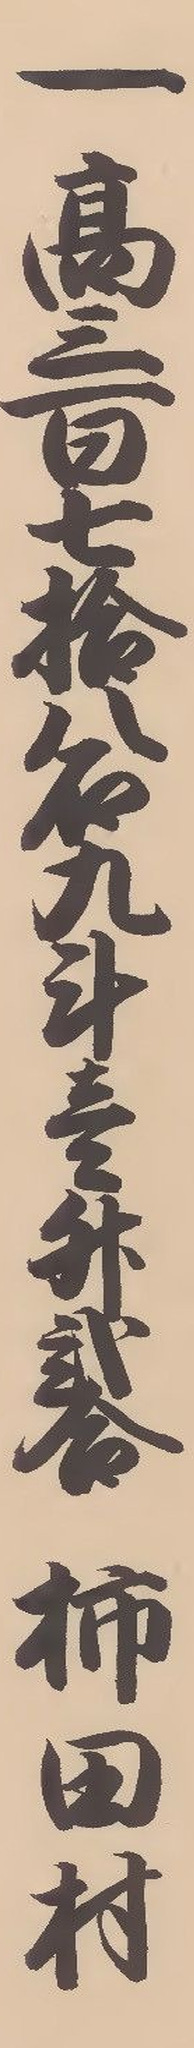一高三百七拾八石九斗壱升弐合柿田村
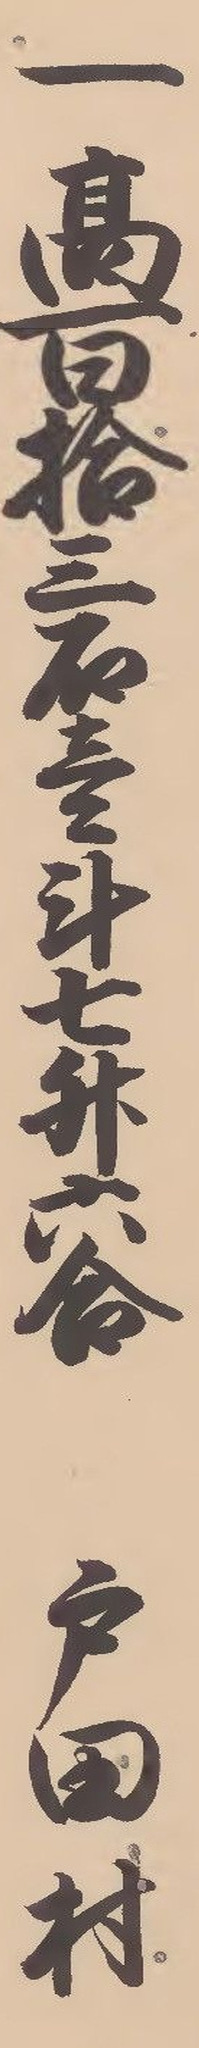一高百拾三石壱斗七升六合戸田村
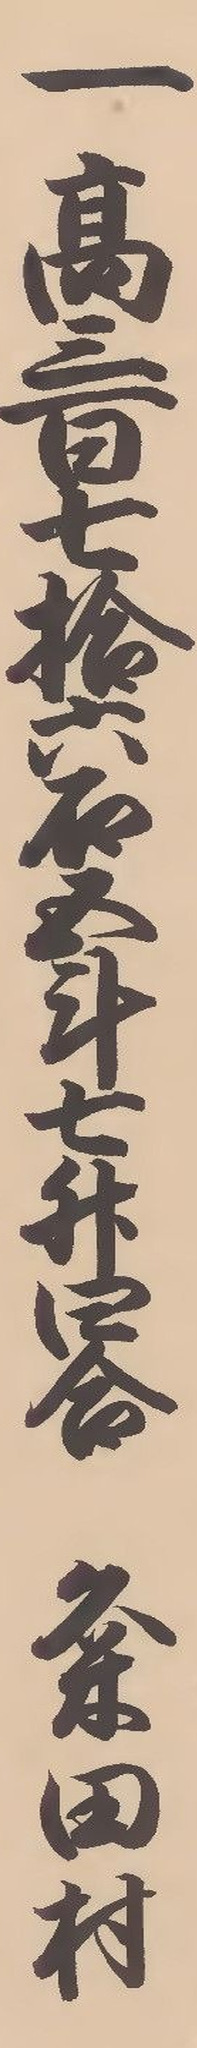一高三百七拾六石五斗七升四合粂田村
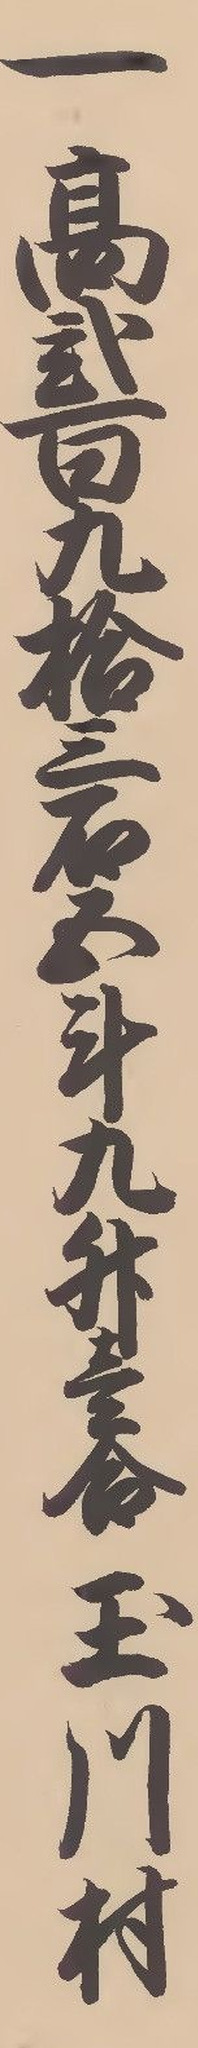一高弐百九拾三石五斗九升壱合玉川村
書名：駿河国郷帳
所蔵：国立公文書館 National Archives of Japan
